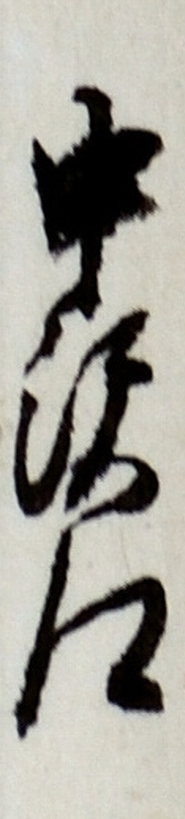中沢郷
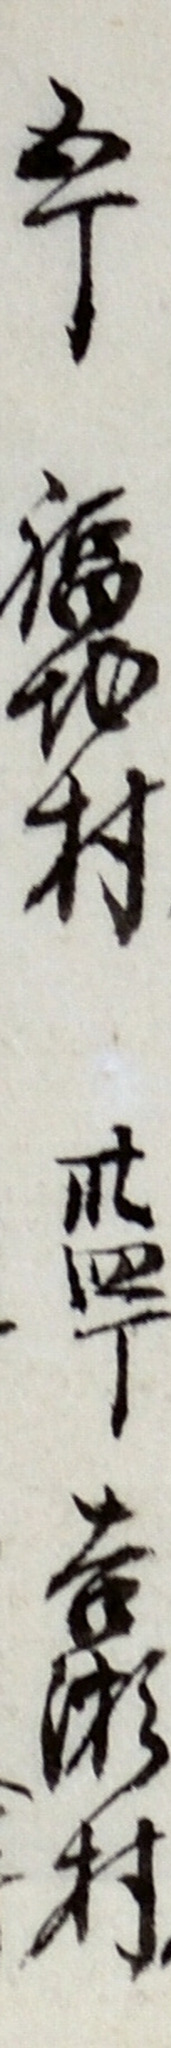五丁福地村卅四丁吉瀬村
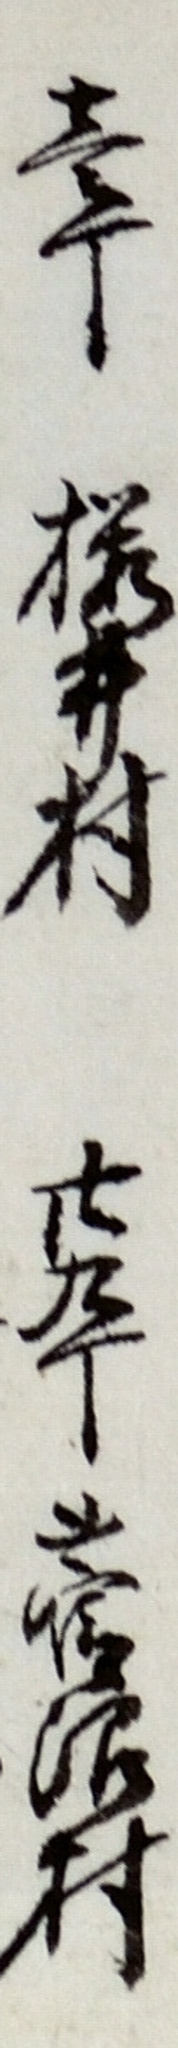壱丁桜井村廿九丁菅沼村
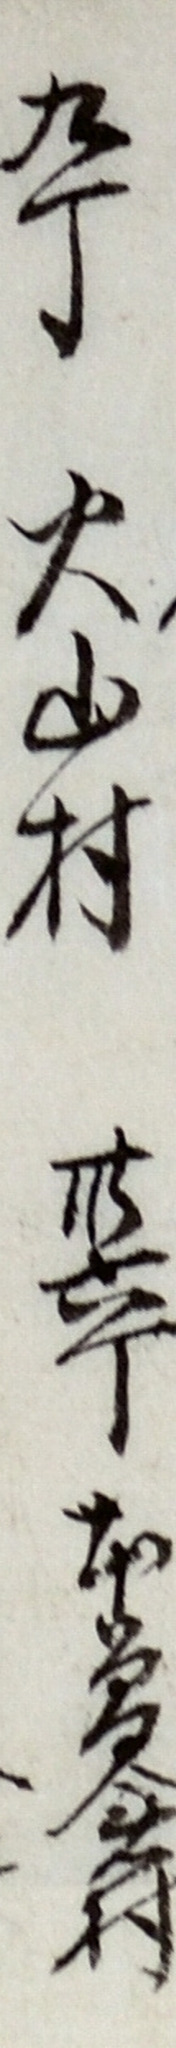九丁火山村卅六丁本曾倉村
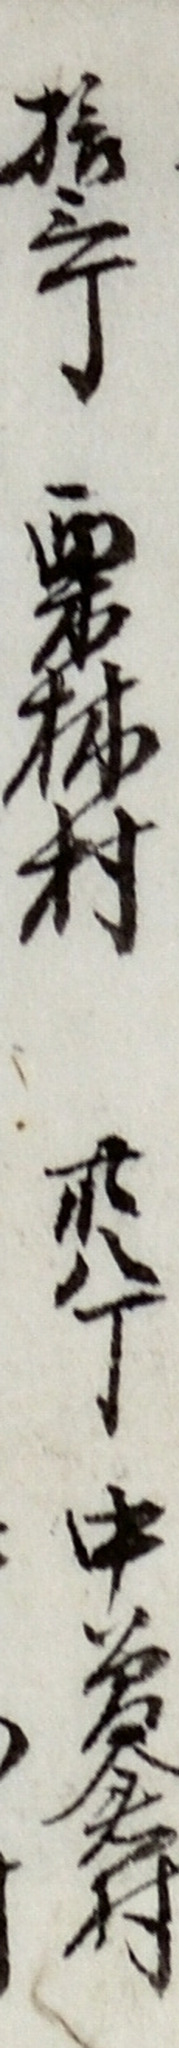拾三丁栗林村卅八丁中曾倉村
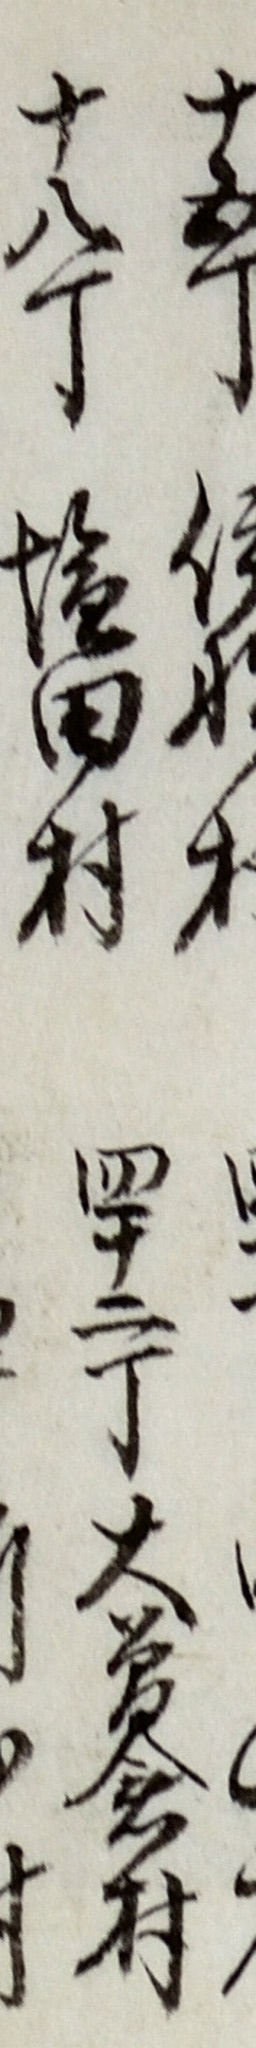十八丁塩田村四十二丁大曾倉村
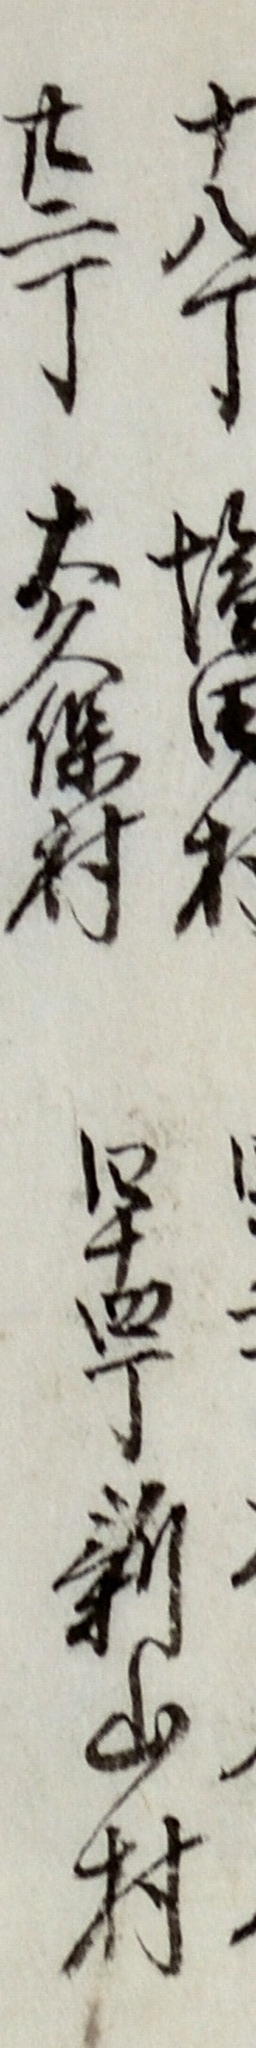廿二丁大久保村四十四丁新山村
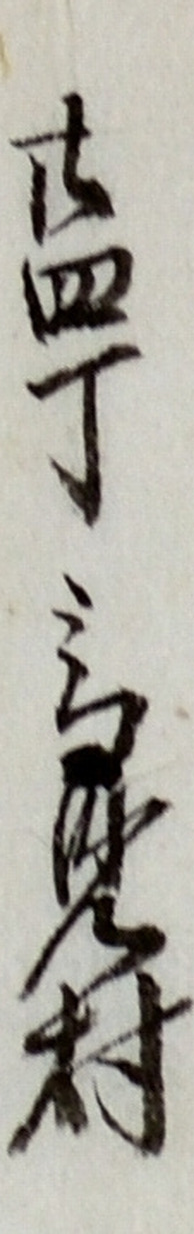廿四丁高見村

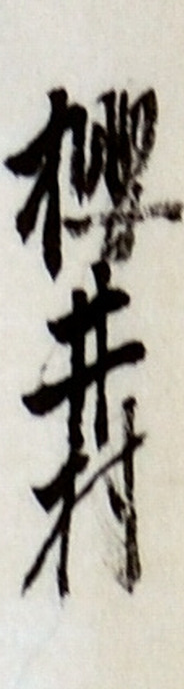桜井村
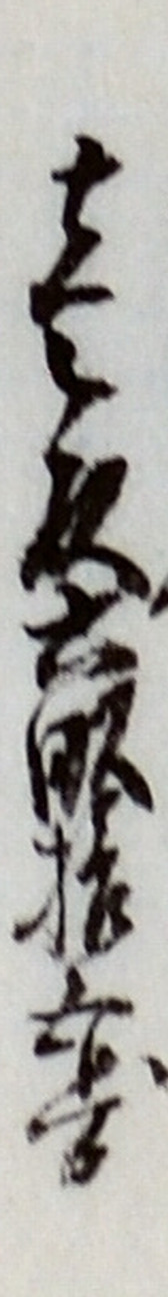壱反六畝拾五歩長助
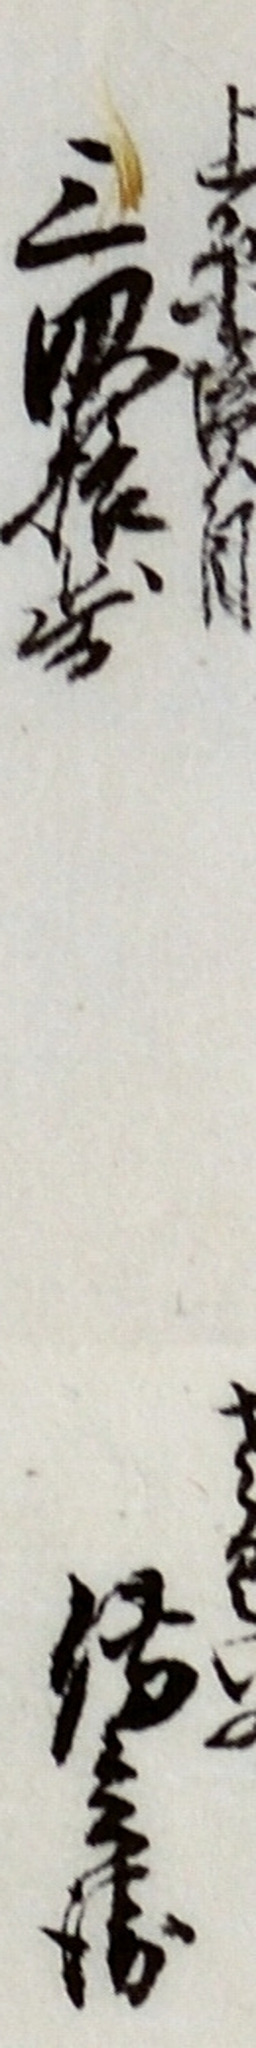三畝拾歩伝兵衛
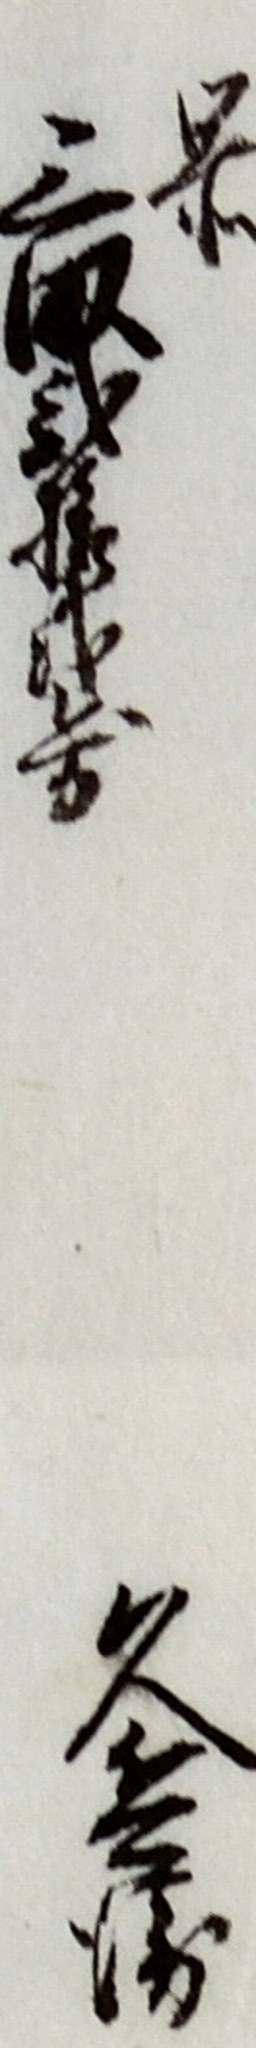三畝弐拾弐歩久兵衛
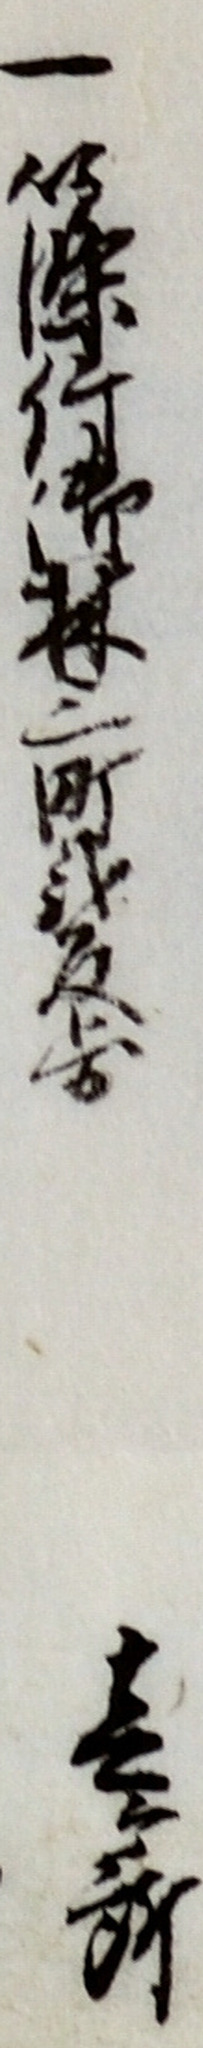一篠竹御林三町弐反歩壱ヶ所

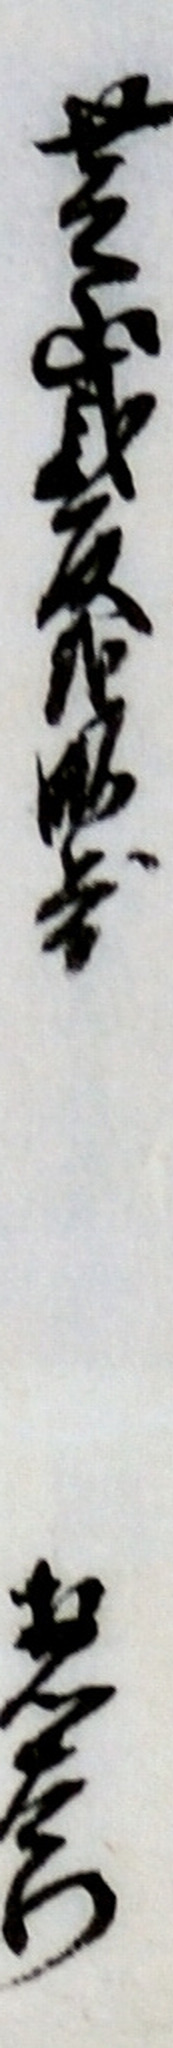芝山弐反弐畝歩惣右衛門
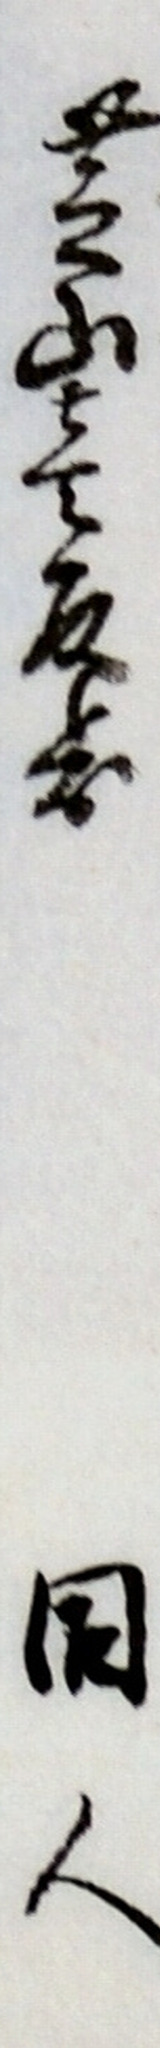芝山壱反歩同人
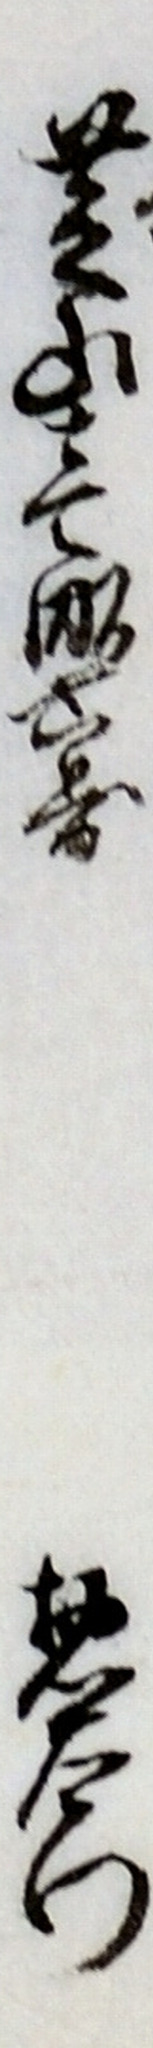芝山壱畝六歩惣右衛門
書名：御領分中山林社地手控
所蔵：伊那市立高遠町図書館・合同会社AMANE
